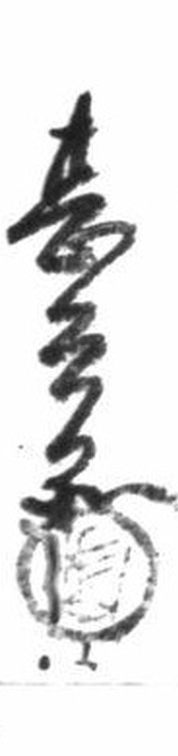甚兵衛
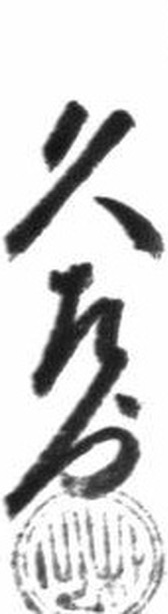久左衛門
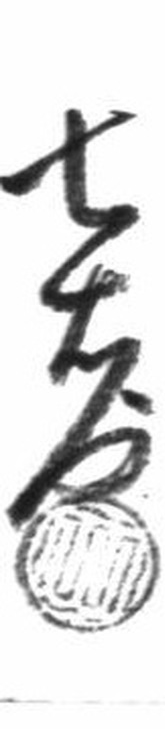七右衛門
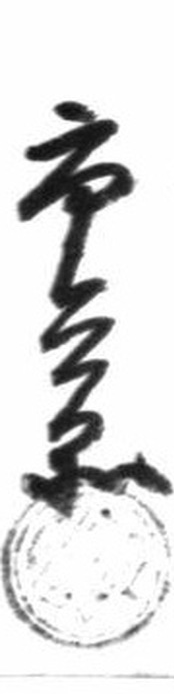市兵衛
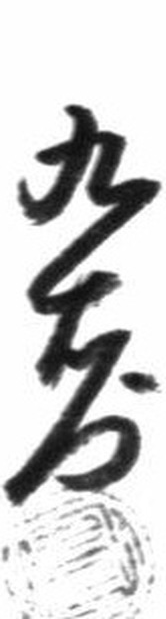九右衛門
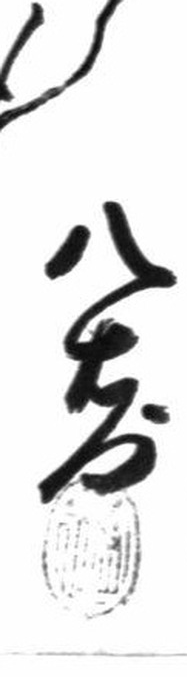八右衛門
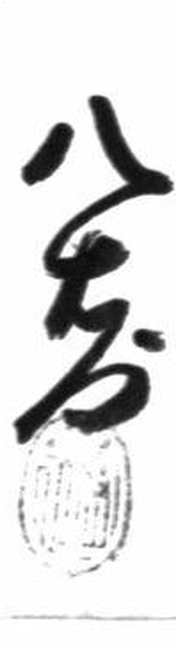八右衛門
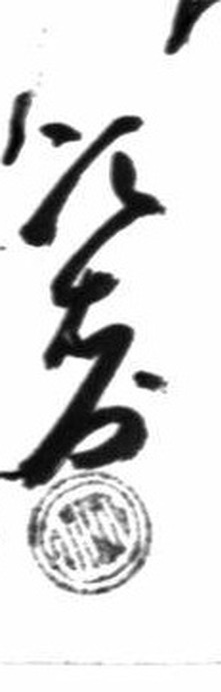吉右衛門
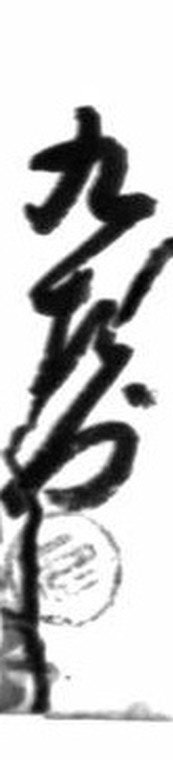九左衛門
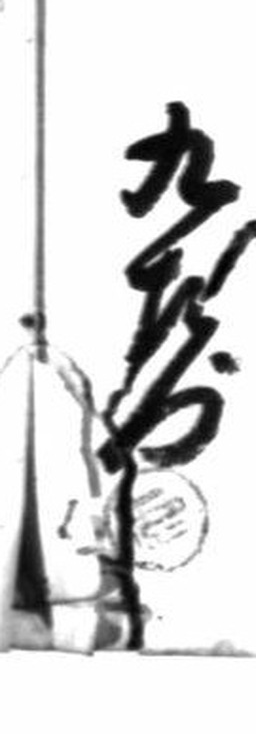九左衛門
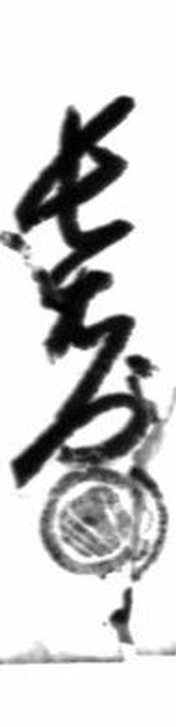吉右衛門
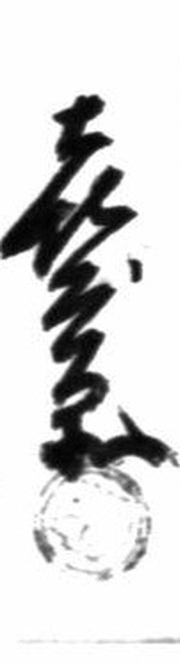徳兵衛
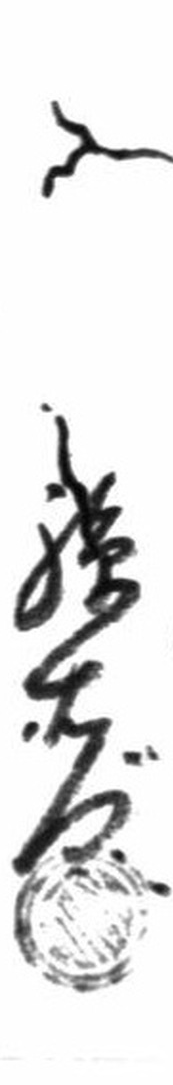吉右衛門
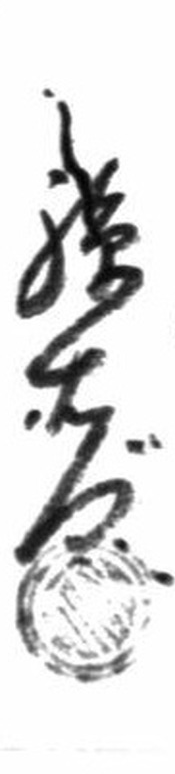吉右衛門

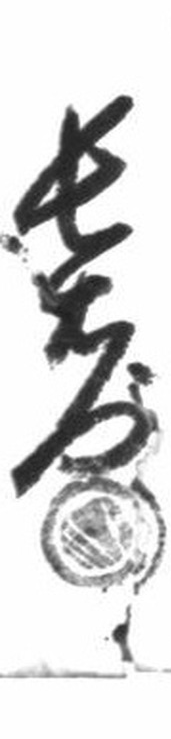長右衛門
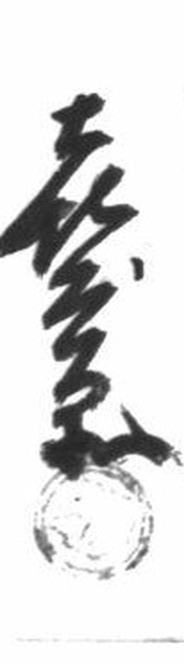喜兵衛
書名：宝永弐酉五月火之用心護摩之灰御改帳証文
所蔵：福井県文書館 Fukui Prefectural Archives
